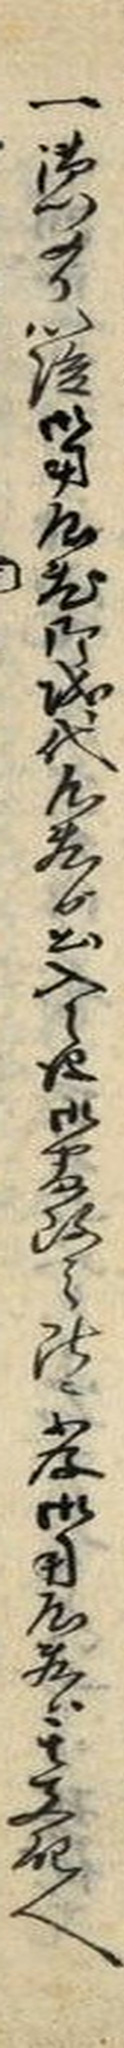一御門〆り以後御用屋敷御城代屋敷ゟ出入之儀御番改之断ニ不及御用屋敷屋ハ其支配人
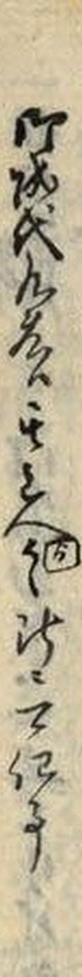御城代屋敷ハ其主人ゟ之断ニ可任事
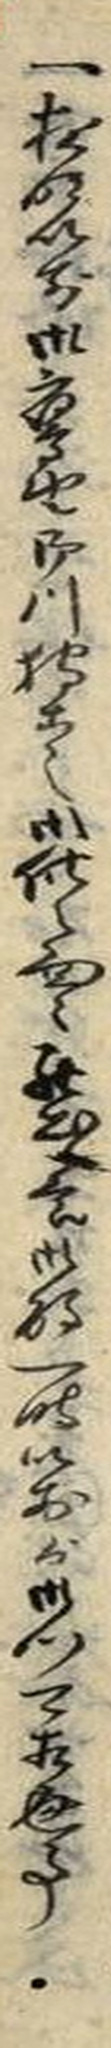一夜明以前御鷹野御川狩等之御供之面々罷出候節御触一時以前ゟ御門可相通事

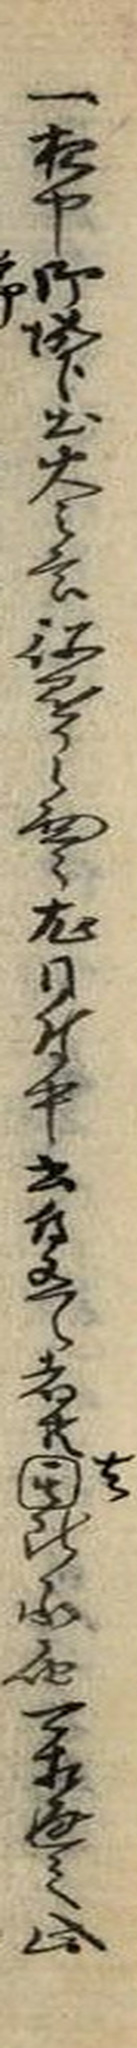一夜中御城下出火之節役懸り之面々尤目付中書付有之者共は其断承届可相通之此
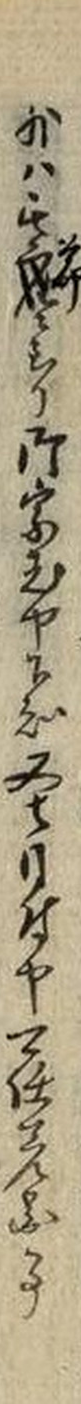外ハ其節ニ至り御家老中下知又は目付中可任差図事
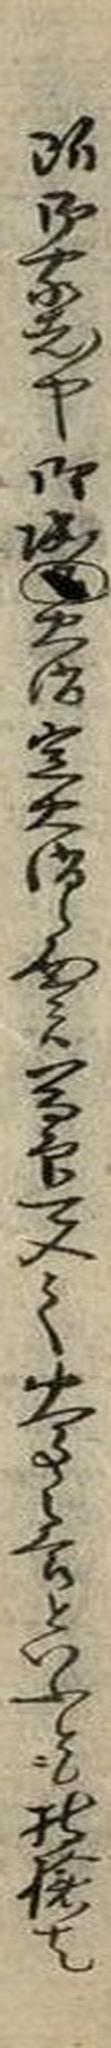附御家老中御城火消定火消之面々ニハ馬印可入之火事之節といふとも持槍は
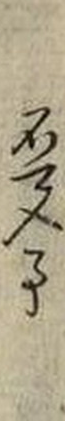不可入事
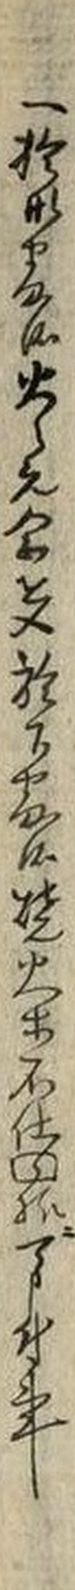一於御番所火之元念を入於下番所焼火等不仕候様可申付事
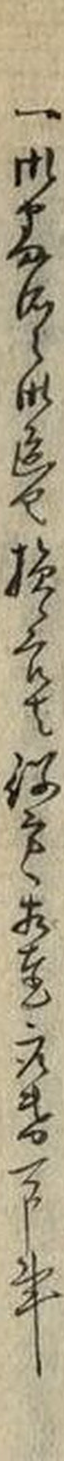一御番所之御道具損候節は役方へ相達取替可申事
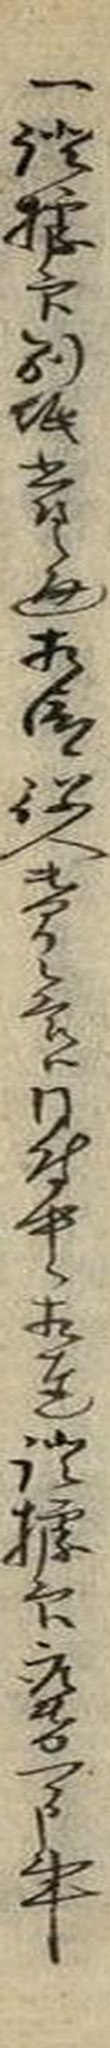一証拠印別紙書付之通相渡候役人替り之節ハ目付中へ相達証拠印取替可申事
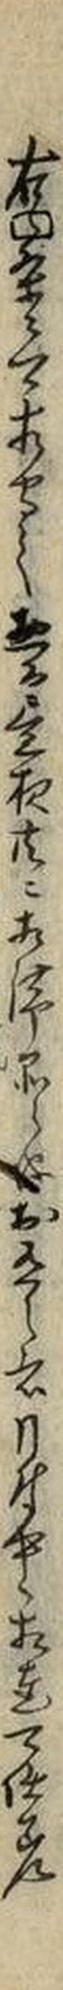右之条々可相守之惣而昼夜共ニ相滞品之儀於有之は月番中へ相達可任差
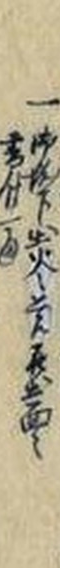一御城下出火之節差出面々
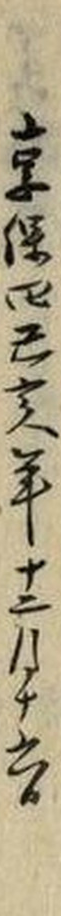享保四己亥年十二月十六日
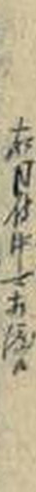右目付中可相渡候
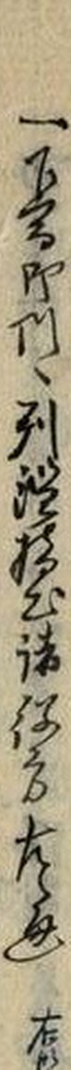一下馬御門へ判鑑指出諸役方左之通
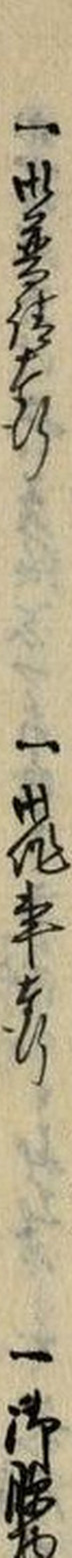一御普請奉行一御作事奉行一御腰物方
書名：御門御櫓之部
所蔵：福井県文書館 Fukui Prefectural Archives
